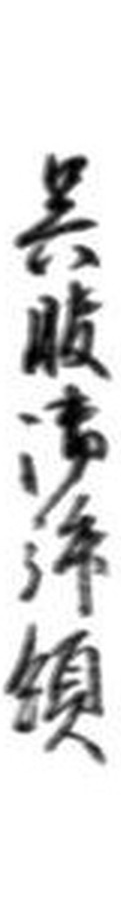呉服御拝領
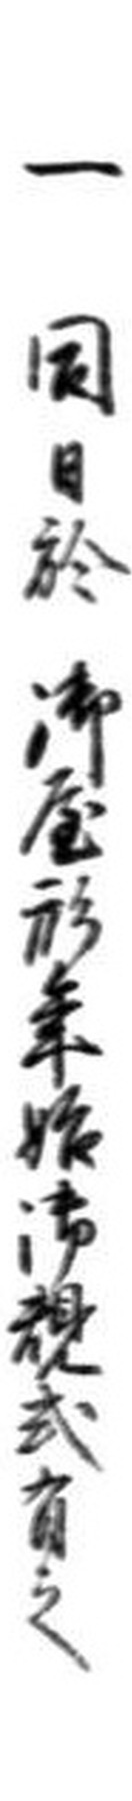一同日於御屋形年始御規式有之
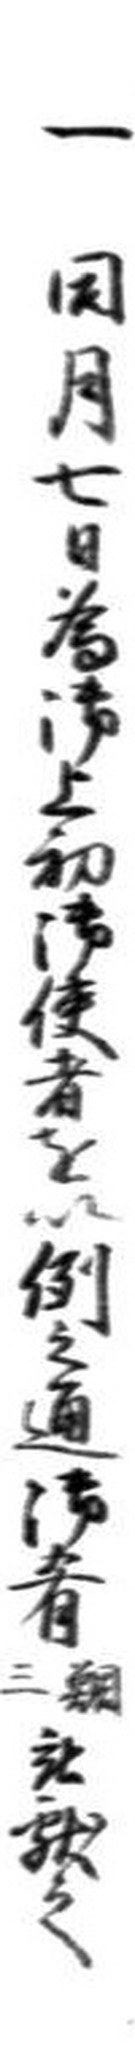一同月七日為御上初使者を以例之通御肴鯛三被献之
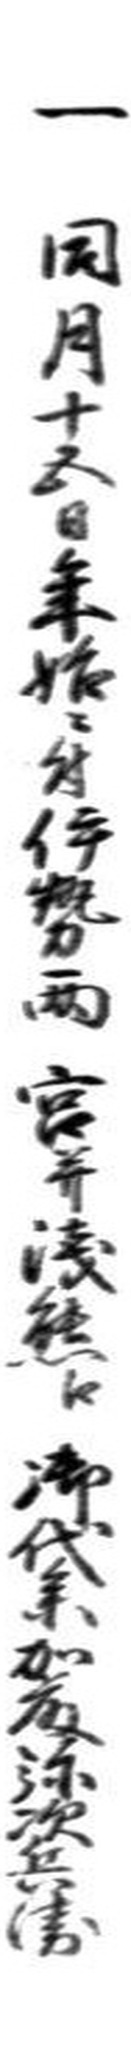一同月十五日年始ニ付伊勢両宮幷浅熊江御代参加藤弥次兵衛
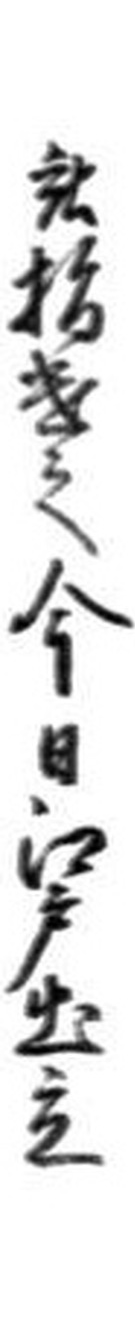被指遣之今日江戸出立
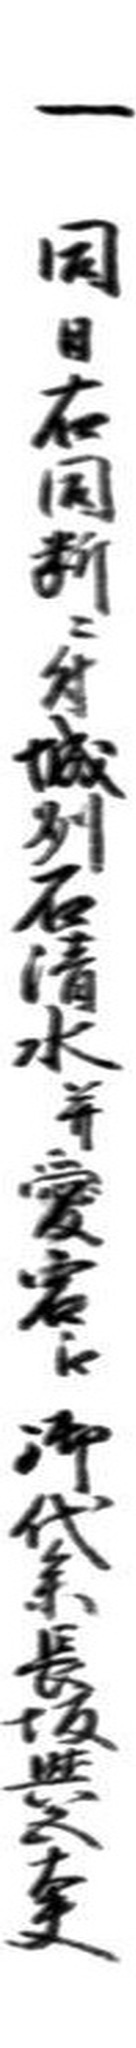一同日右同断二付城州石清水并愛宕江御代参長坂与五太夫

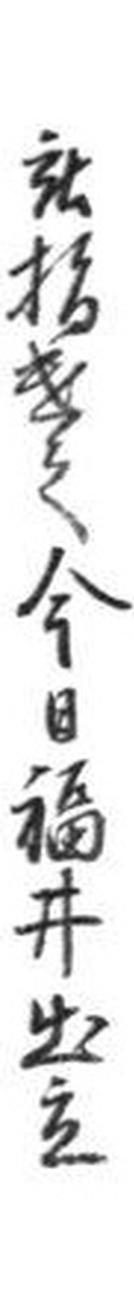被指遣之今日福井出立
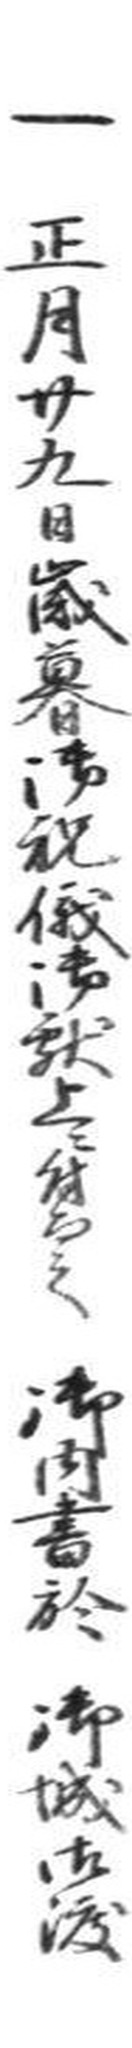一正月廿九日歳暮御祝儀御献上ニ付而之御内書於御城御渡
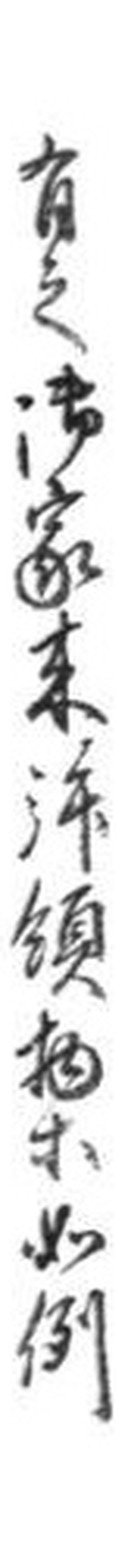有之御家来拝領物等如例
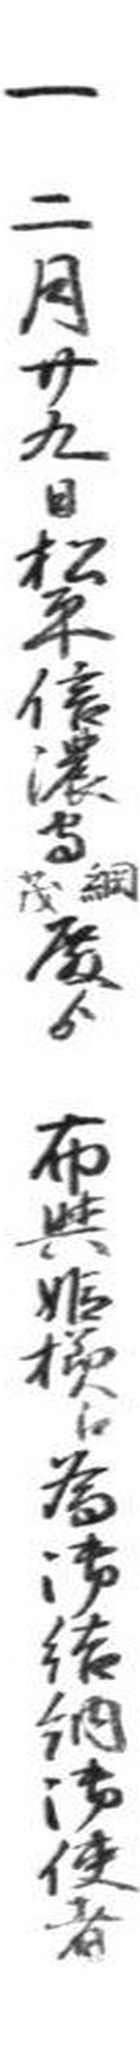一二月廿九日松平信濃守綱茂殿ゟ布与姫様江為御結納御使者
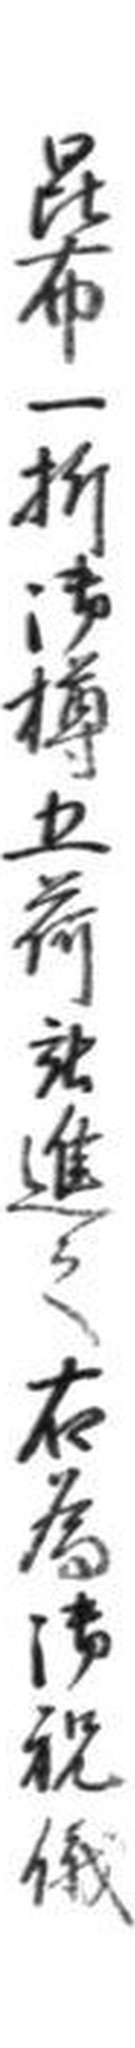昆布一折御樽五荷被進之右為御祝儀
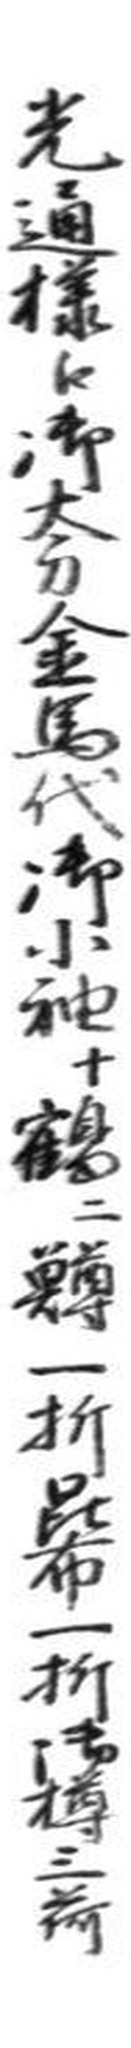光通様江御太刀金馬代御小袖十鶴二鱒一折昆布一折御樽三荷
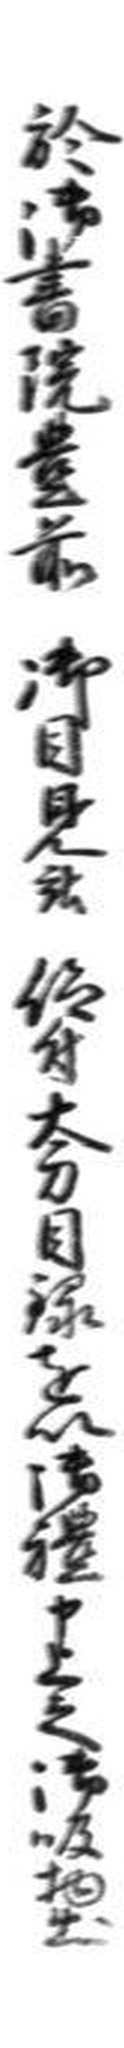於御書院豊前御目見被仰付太刀目録を以御礼申上之御吸物出
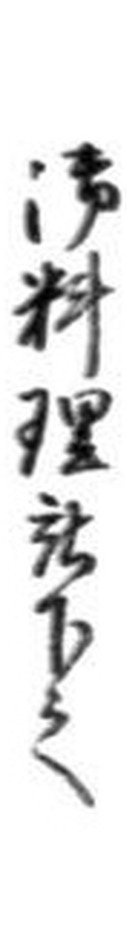御料理被下之
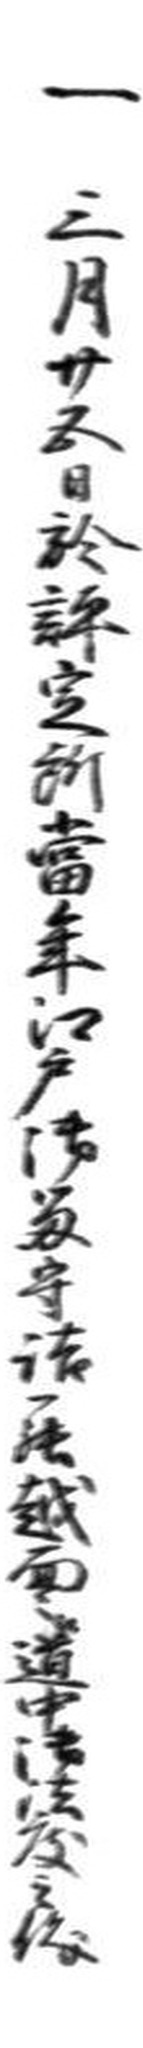一三月廿五日於評定所当年江戸御留守詰罷越面々道中御法度之儀
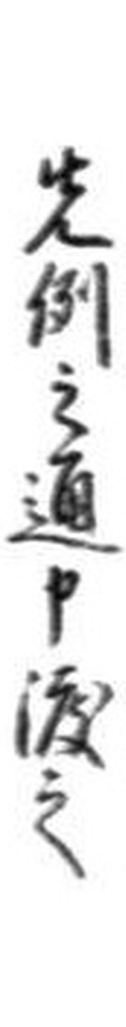先例之通申渡之
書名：家譜 七 光通公 従寛文四年到同九年
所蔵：福井県文書館 Fukui Prefectural Archives
